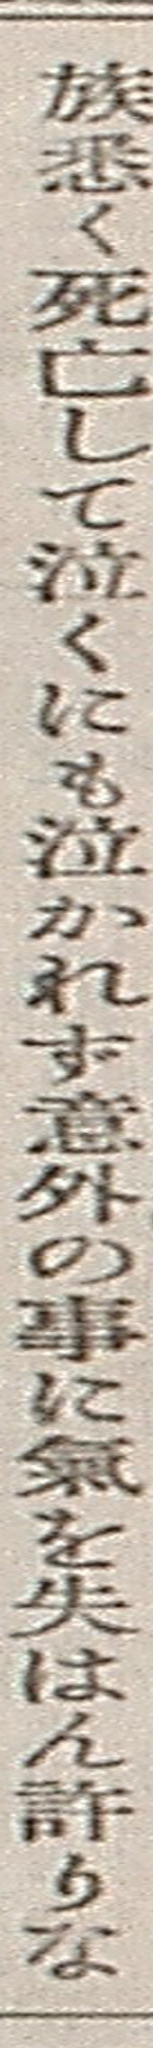族悉く死亡して泣くにも泣かれず意外の事に気を失はん許りな
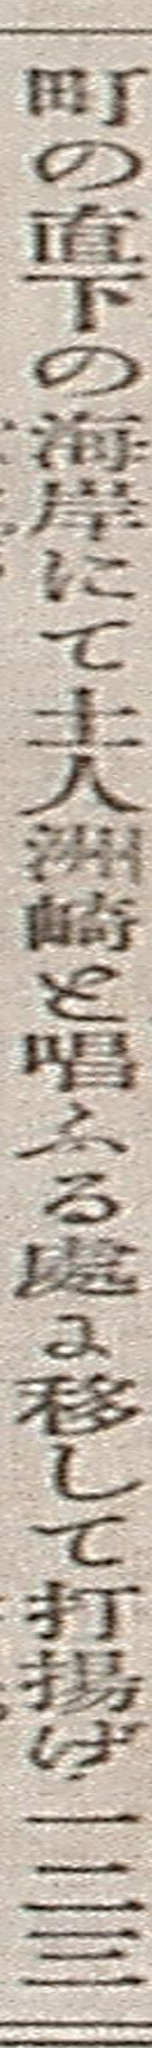町の直下の海岸にて土人洲崎と唱ふる処に移して打揚げ一二三
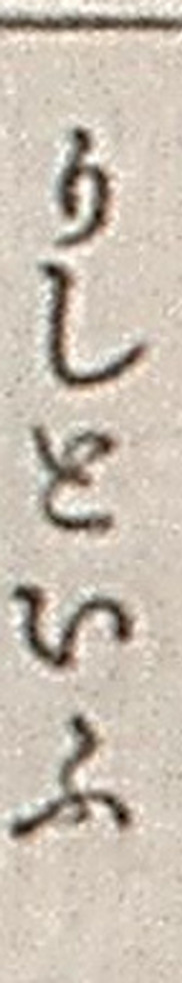りしといふ
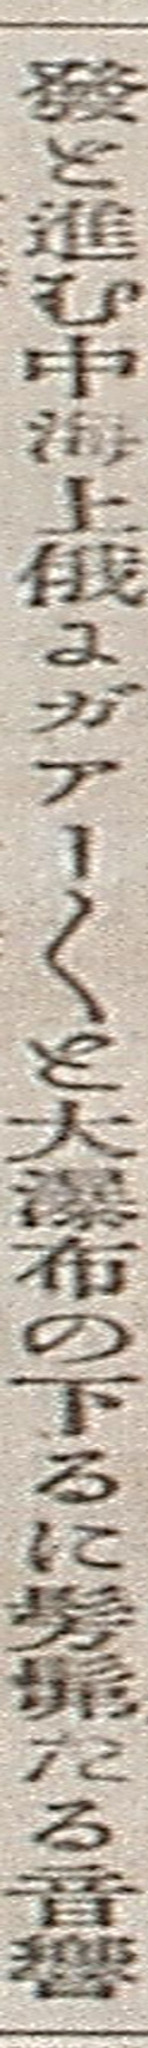発と進む中海上俄にガアー〳〵と大瀑布の下るに髣髴たる音響
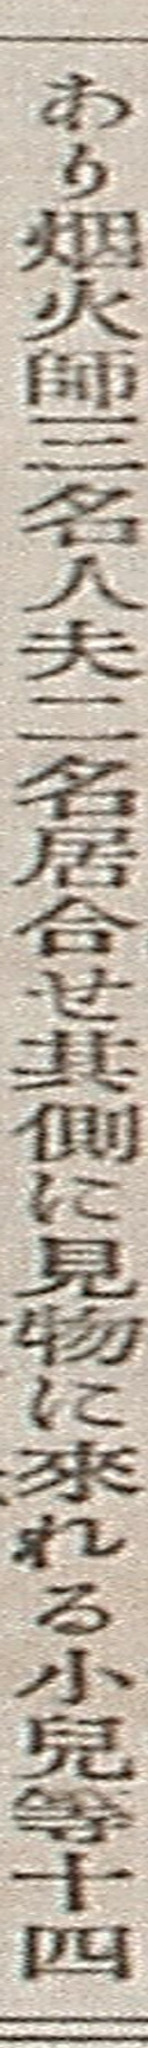あり烟火師三名人夫二名居合せ其側に見物に来れる小児等十四
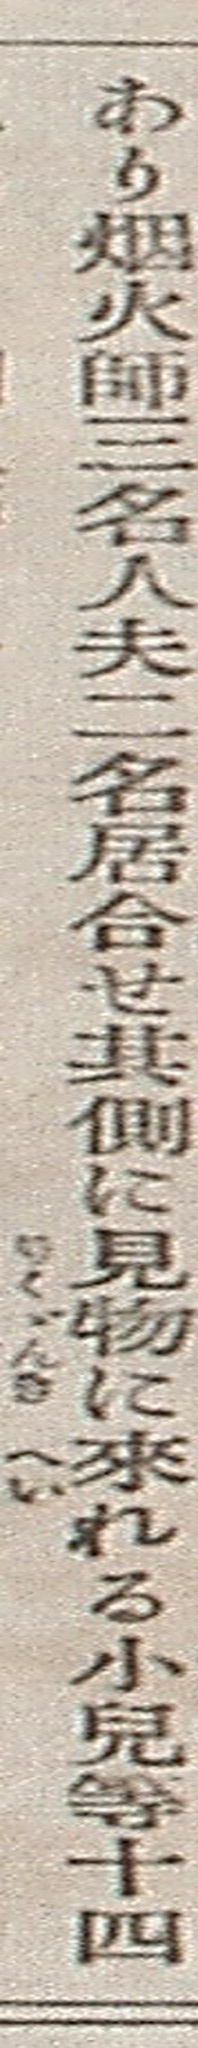あり烟火師三名人夫二名居合せ其側に見物に来れる小児等十四
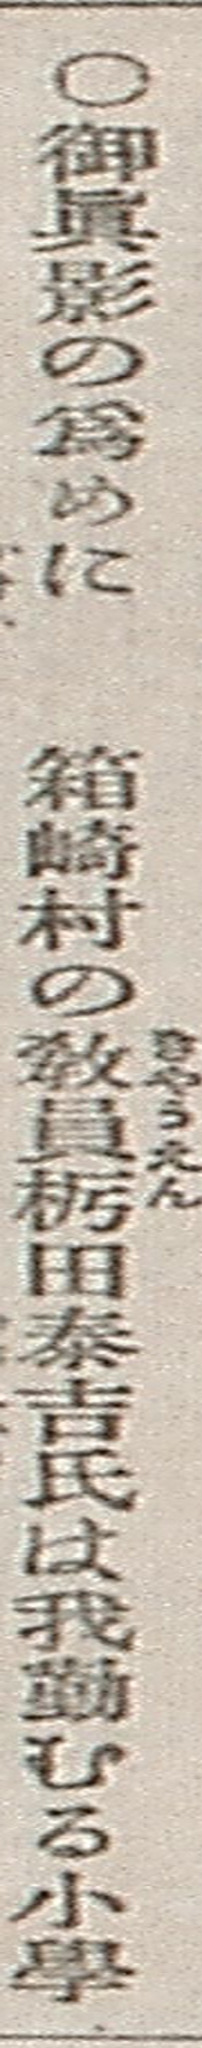○御真影の為めに箱崎村の教員栃田泰吉氏は我勤むる小学
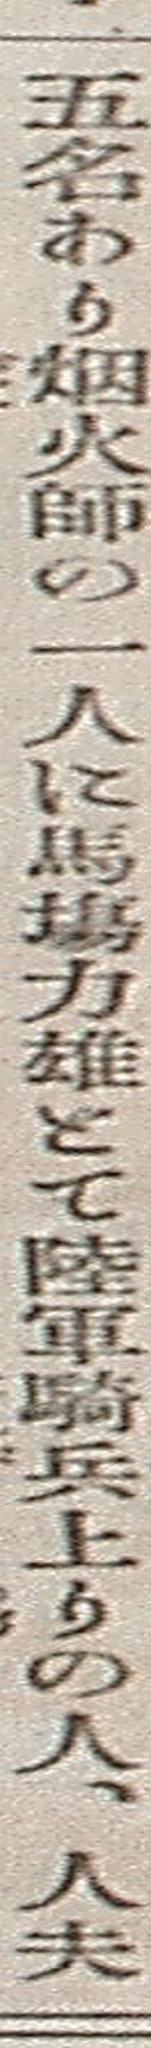五名あり烟火師の一人に馬場力雄とて陸軍騎兵上りの人、人夫
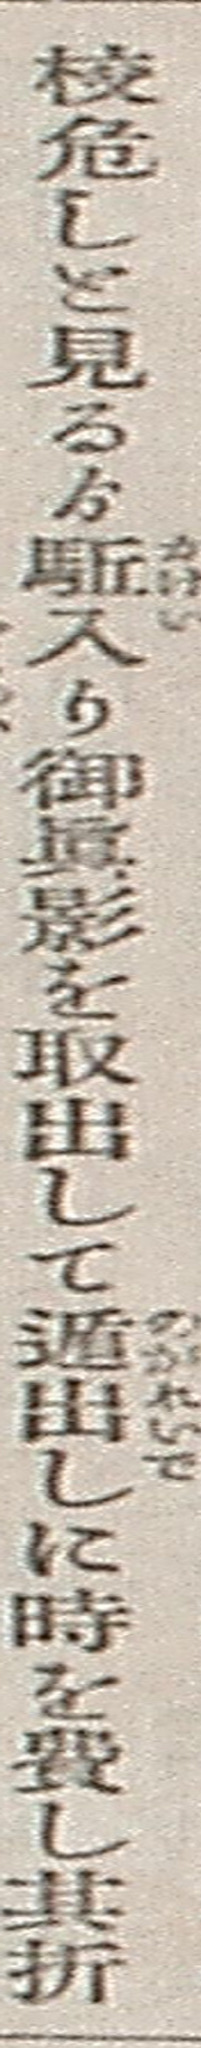校危しと見るゟ駈入り御真影を取出して遁出しに時を費し其折
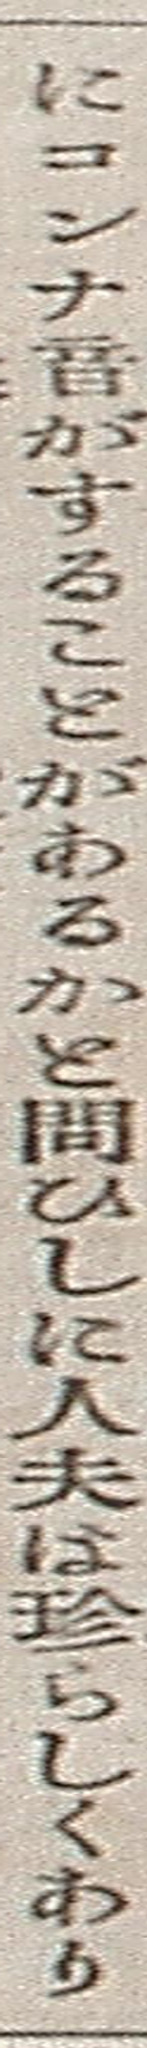にコンナ音がすることがあるかと問ひしに人夫は珍らしくあり
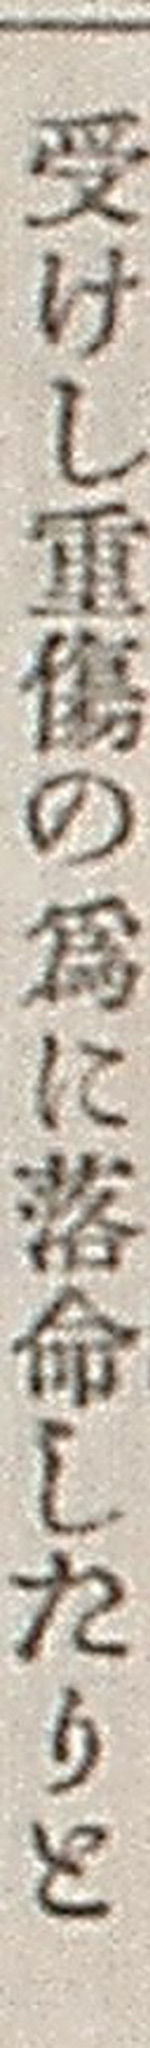受けし重傷の為に落命したりと
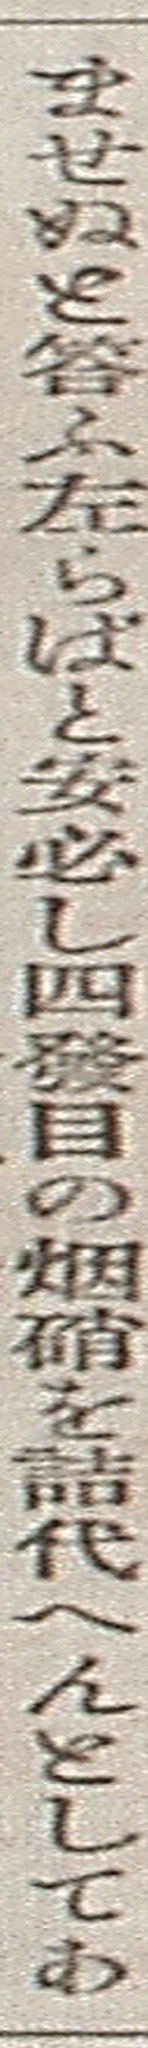ませぬと答ふ左ならばと安心し四発目の烟硝を詰代へんとしてあ
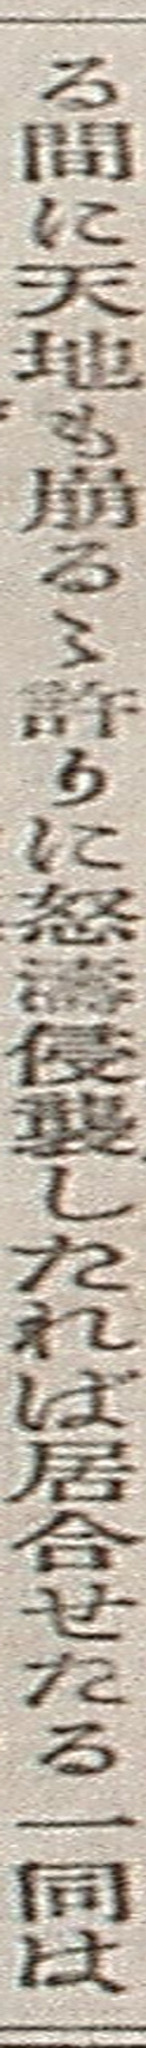る間に天地も崩る〻許りに怒濤侵襲したれば居合せたる一同は
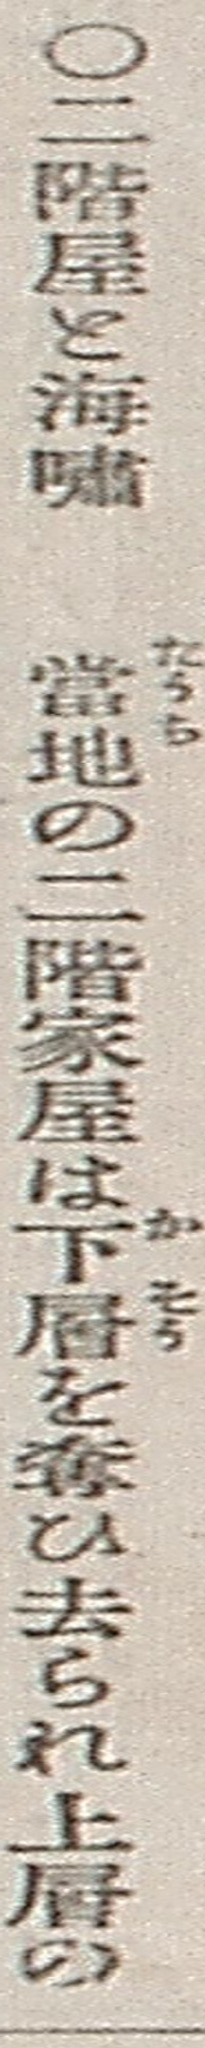○二階屋と海嘯当地の二階家屋は下層を奪ひ去られ上層の
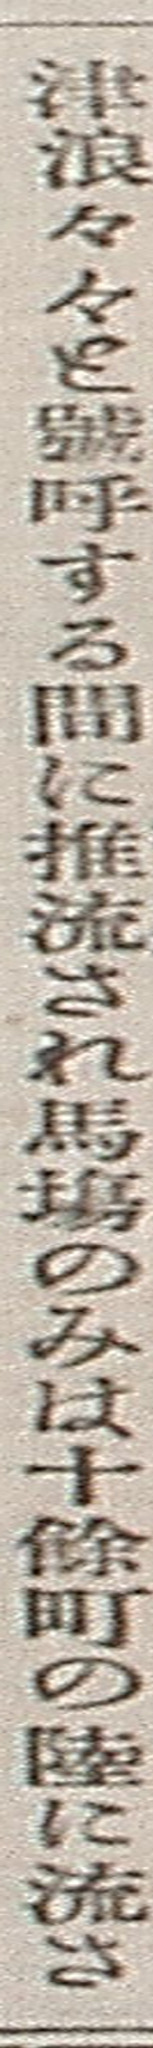津浪々々と号呼する間に推流され馬場のみは十余町の陸に流さ

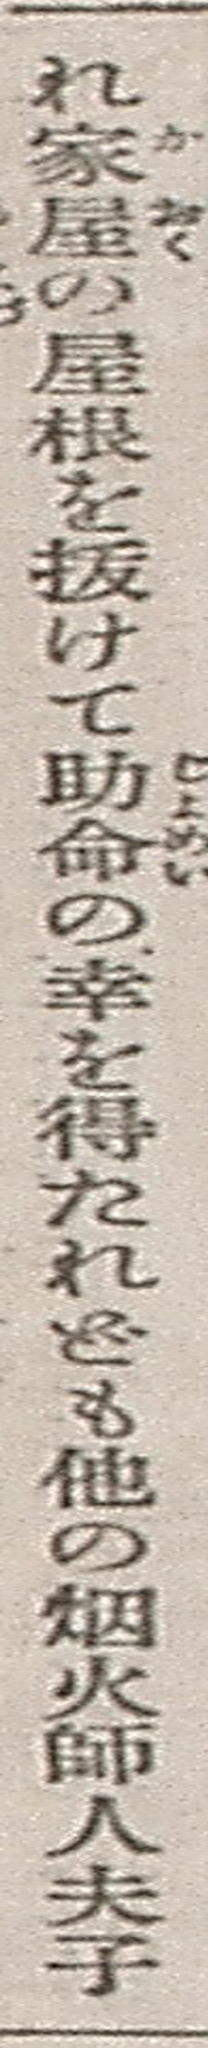れ家屋の屋根を抜けて助命の幸を得たれども他の烟火師人夫子
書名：風俗畫報臨時増刊第百十九號　大海嘯被害録（中）
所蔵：東京大学地震研究所図書室 Earthquake Research Institute Library, The University of Tokyo, JAPAN
